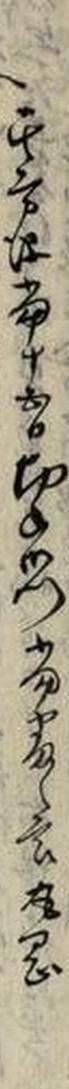其方儀当十五日切手御門当番之節丸岡
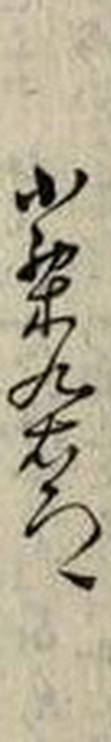小栗九右衛門へ
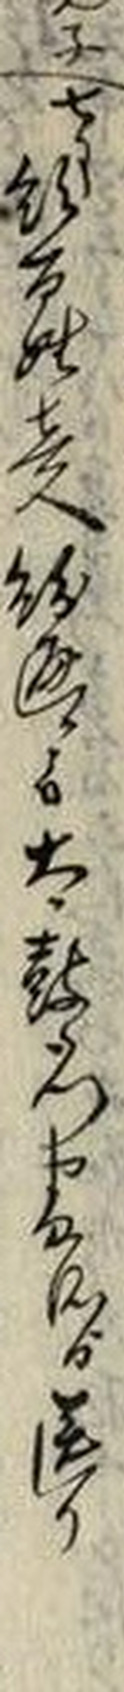領百姓壱人紛通候ニ付太鼓御門番所ゟ送り
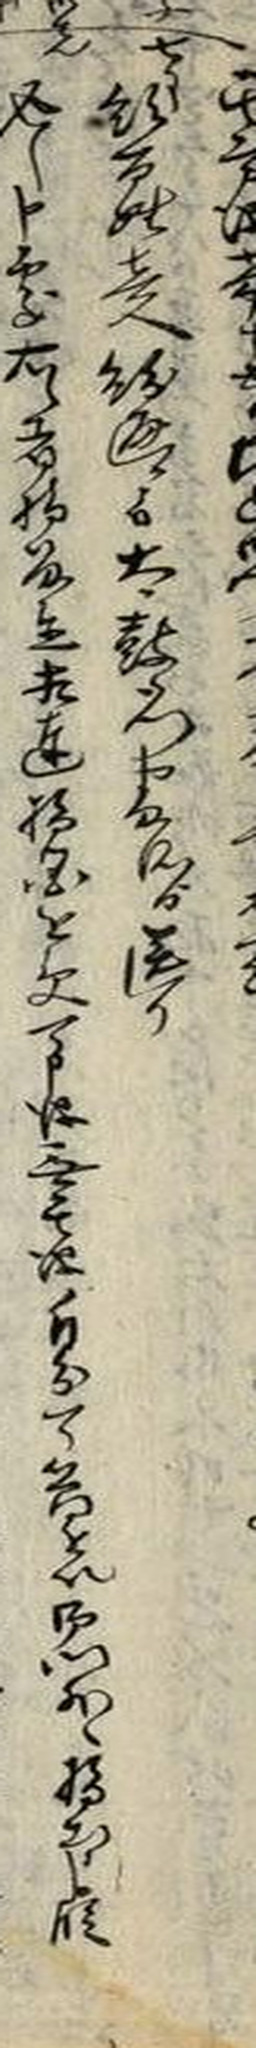返し申処右之者指留置相達指図を受可申儀無其儀自分了簡を以御門外へ指出申候段
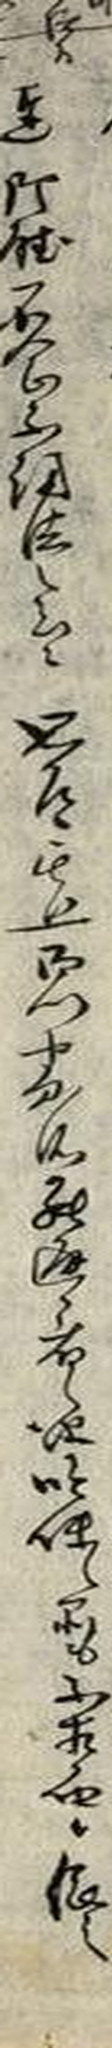達御聴不念不調法之至ニ思召候其上御門番所罷通候者之儀吟味之品も不相届候依之
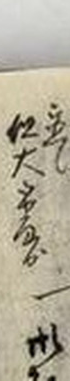但大御番ゟ
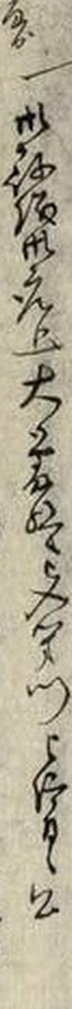御役儀御取上大番組へ被入閉門被仰付候以上
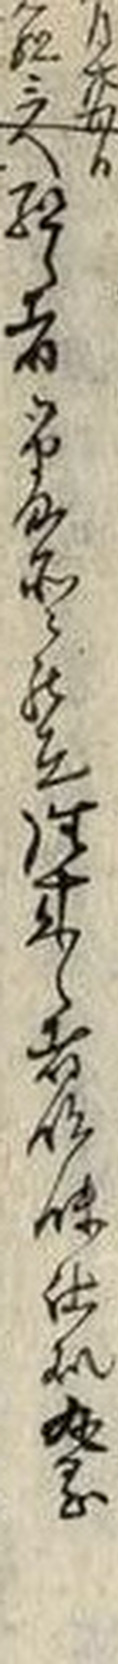組之者御番所ニ罷在往来之者吟味仕処丸岡
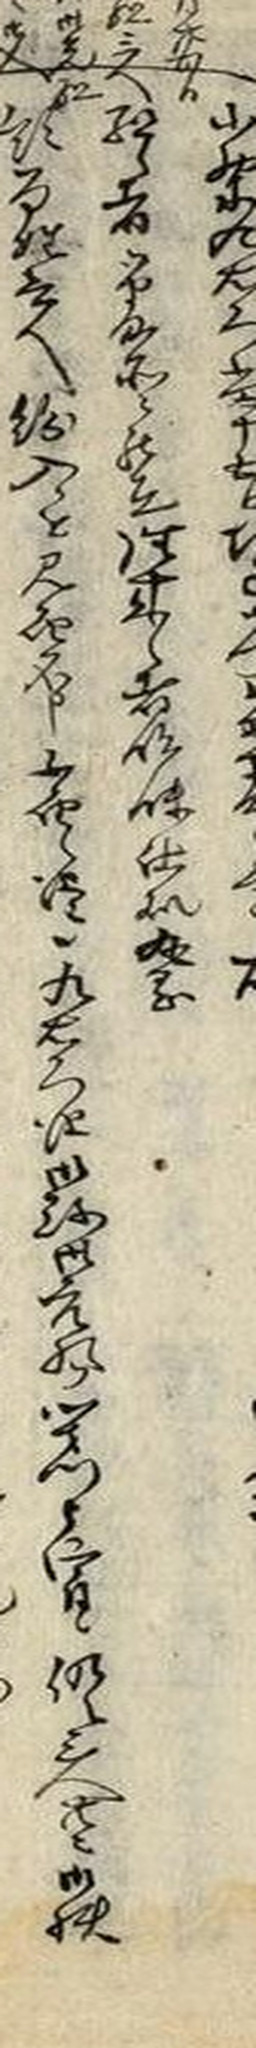領百姓壱人紛入候を見届不申不届之儀ニ候九右衛門儀御役御取揚閉門被仰付候仍之三人共ニ御扶
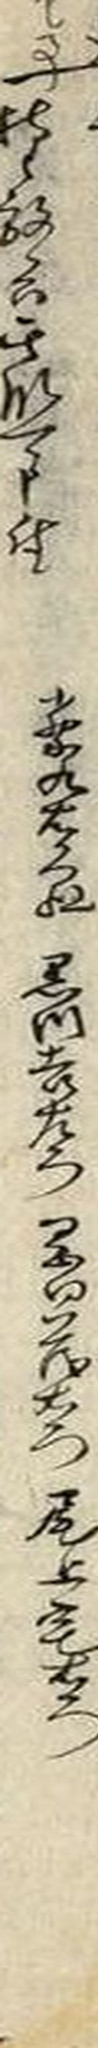持被放候間其段可申付候小栗九右衛門組黒川吉左衛門岡田茂右衛門尾上宅右衛門
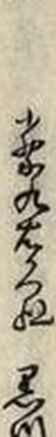小栗九右衛門へ
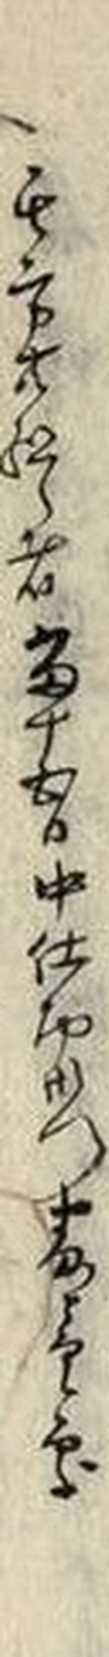其方共組之者当十五日中仕切御門番ニ而候処
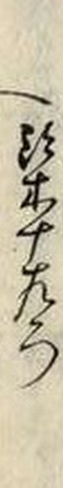鈴木十左衛門
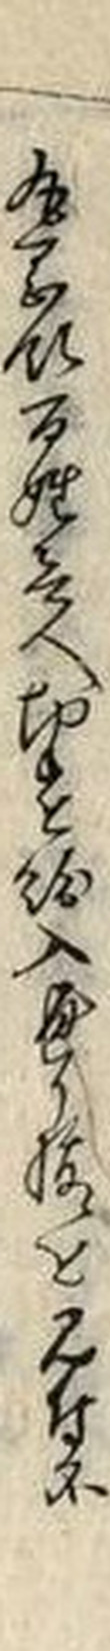丸岡領百姓壱人切手を紛入通り抜候を見付不
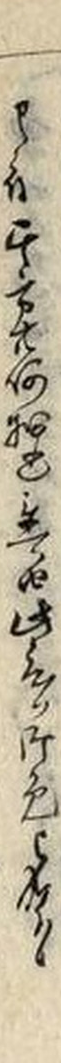申ニ付其方共何押込置候由此度は御免被成下候
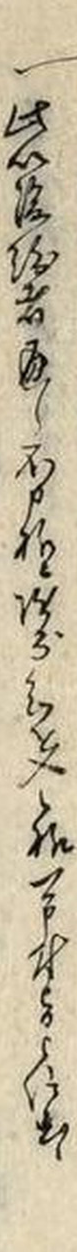此以後紛者通し不申様ニ随分念を入候様可申付旨被仰出候
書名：御門御櫓之部
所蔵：福井県文書館 Fukui Prefectural Archives
